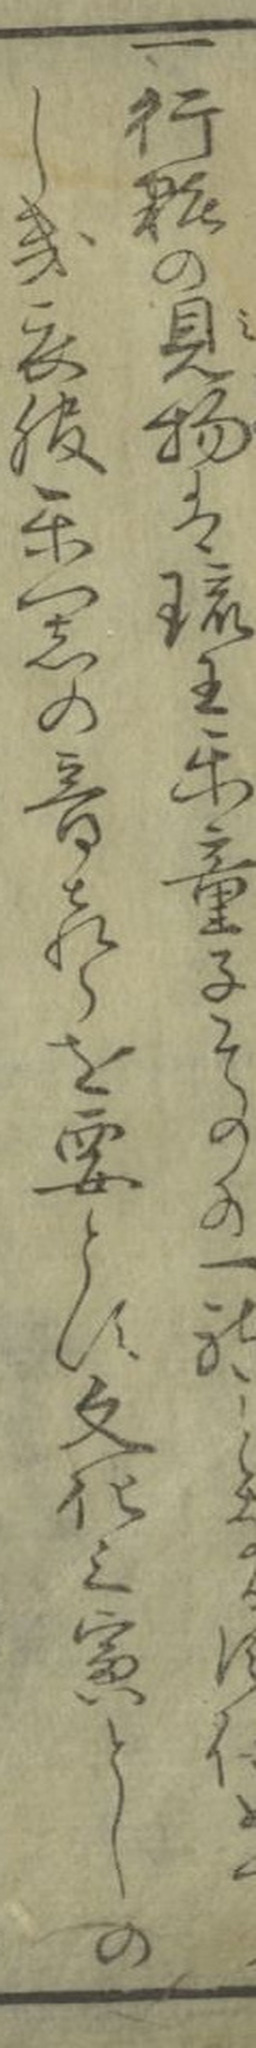しき衣服楽器の音声を要とす文化三寅としの
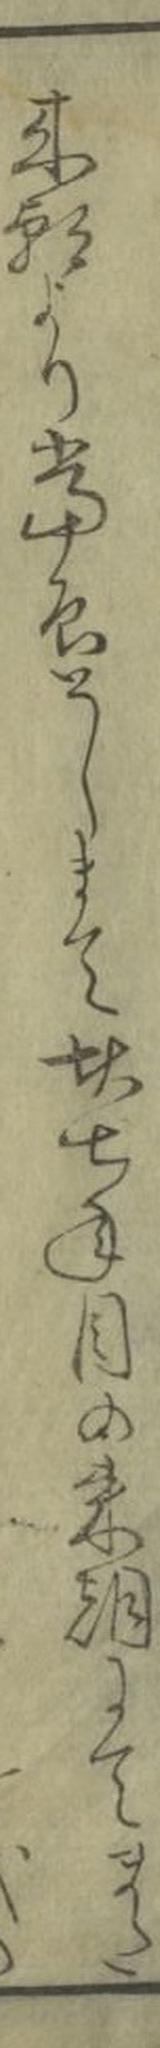来朝より当辰としまて廿七年目の来朝にてまた
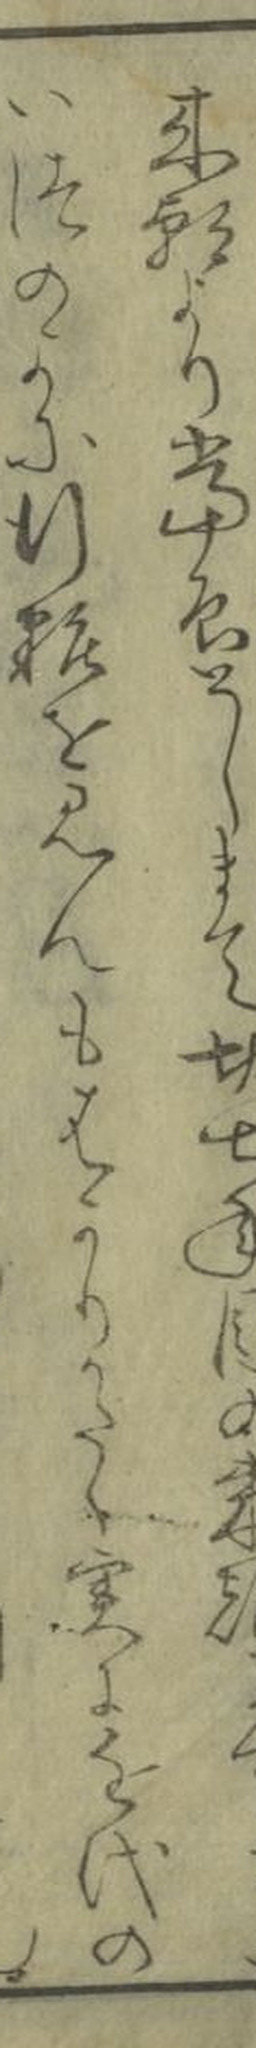いつのよに行粧を見んもはかりかたく実に近代の
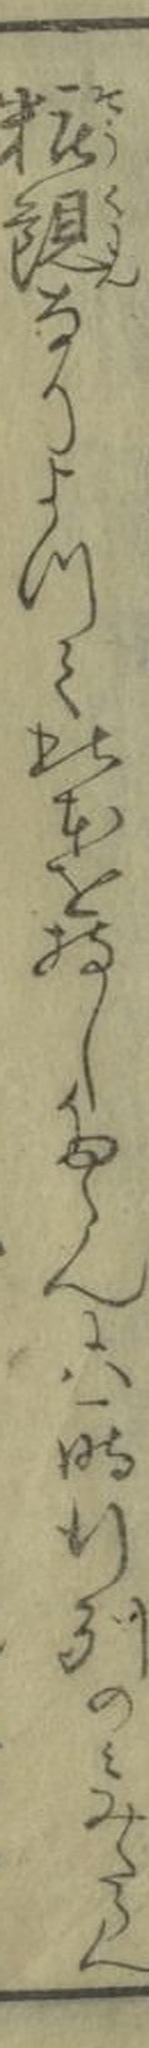粧観なりよつて此本を持したらんには一時行列のみみたらん
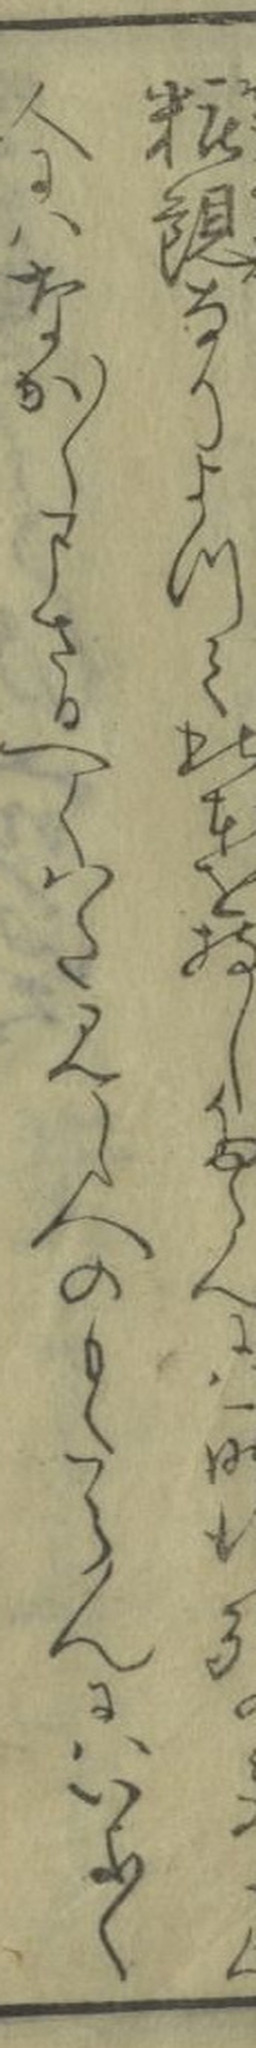人にはなか〳〵まさるへくはた見し人のもたらんにはいよ〳〵
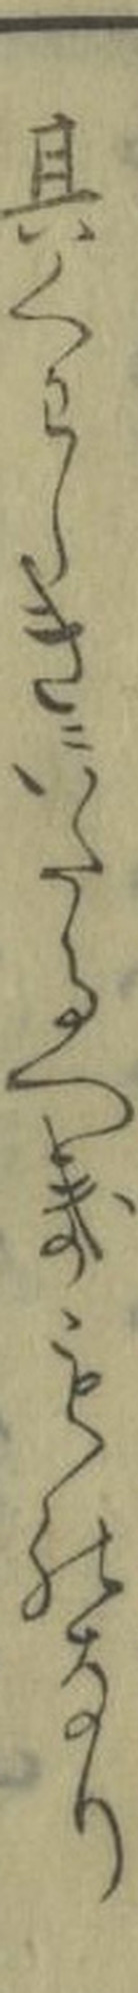其くわしきにいたるへきものなり
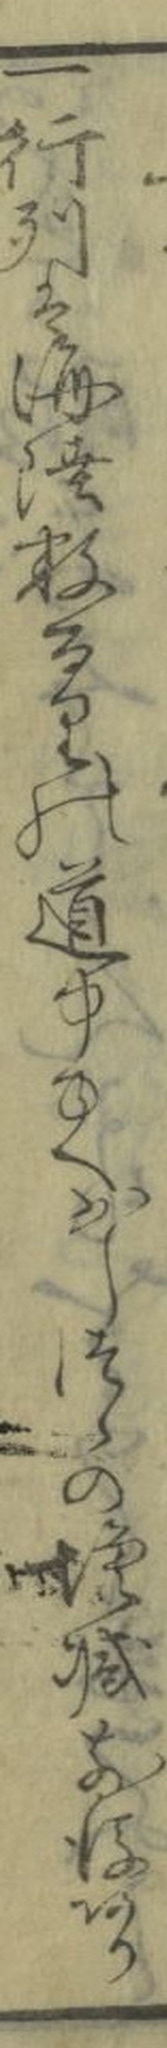一行列は海陸数百里の道中ゆへ少しつゝの増減前後あり
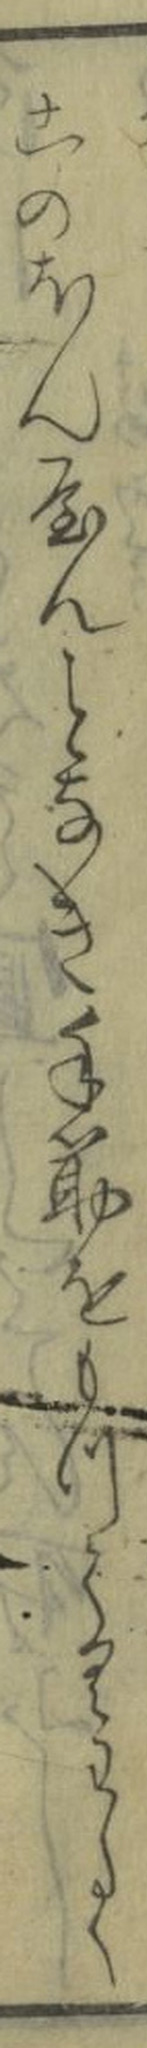このほんやんことなき手筋をもつてくわしく
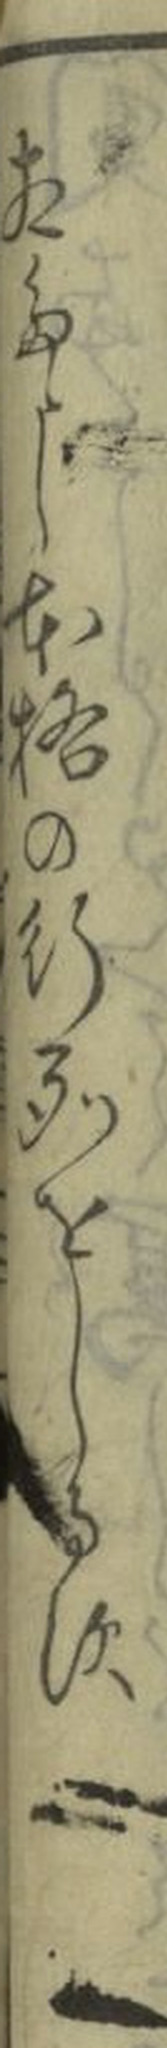相たゝし本格の行列をしるす
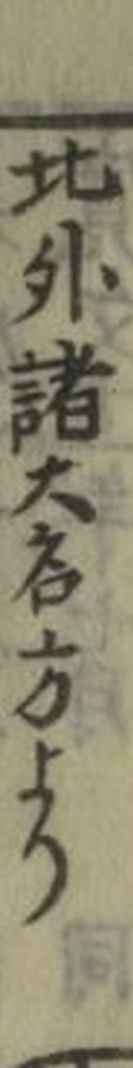此他諸大名方より
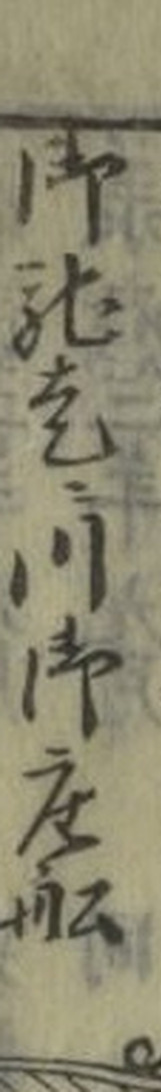御馳走に川御座船
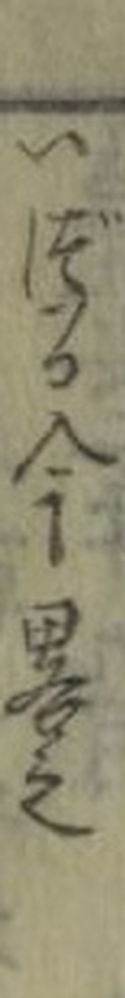いづる今略之

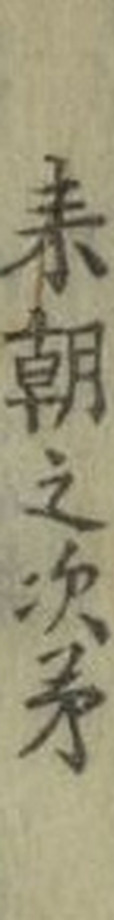来朝之次第
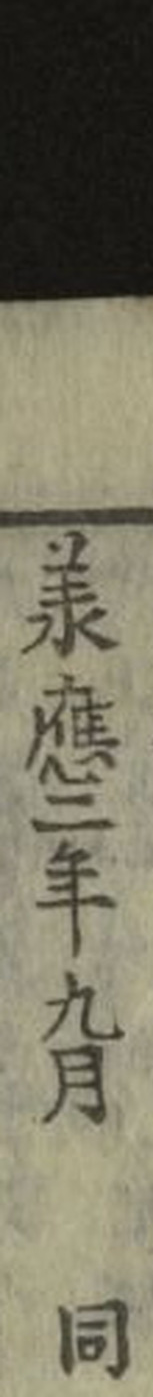承應二年九月同
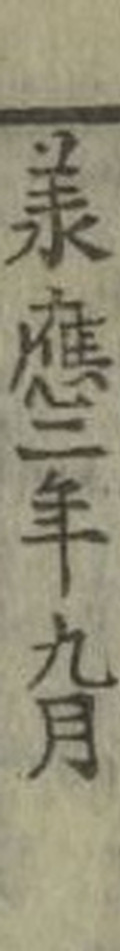承應二年九月同
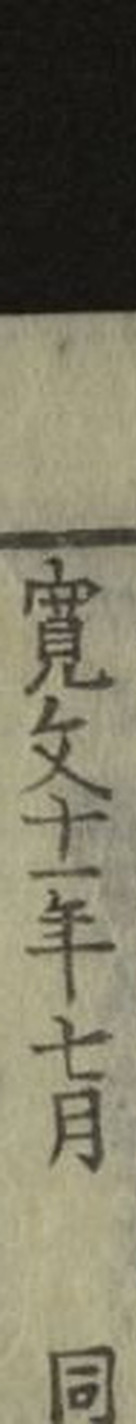寛文十一年七月同
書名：琉球人行列記
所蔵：University of the Ryukyus Library
